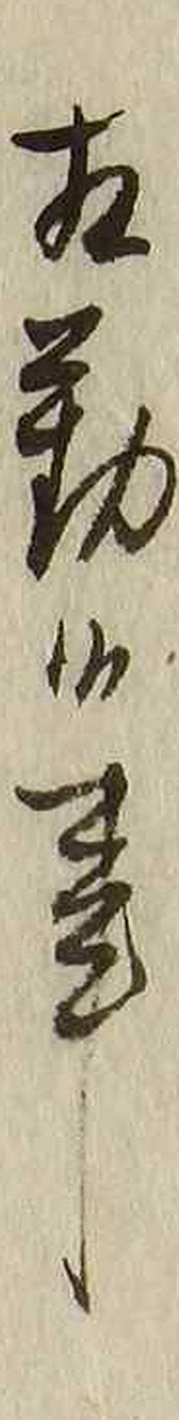相勤候事
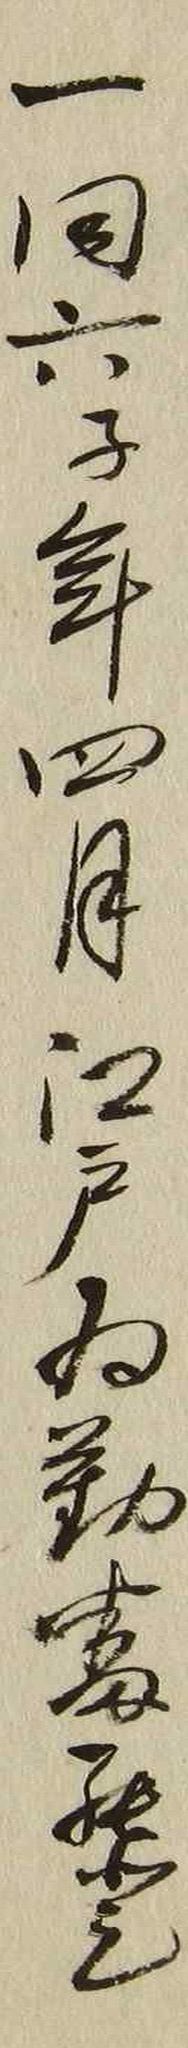一同六子年四月江戸為勤番罷登
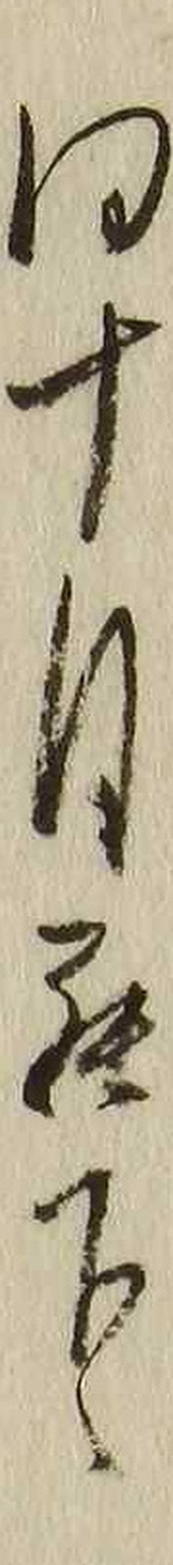同十月罷下候
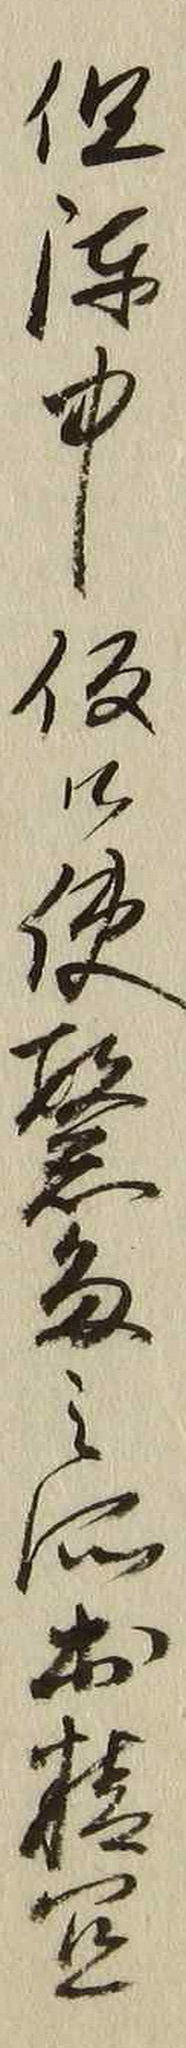但陣中仮御使繁多之所出精宜
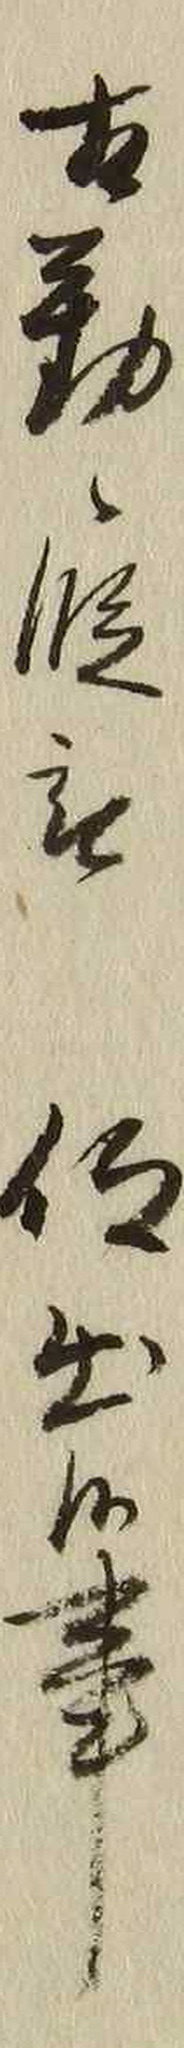相勤候段被仰出候事
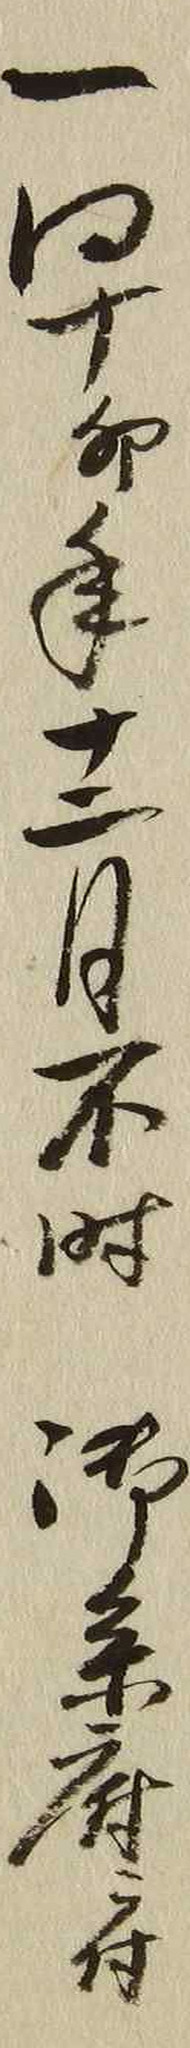一同十卯年十二月不時御参府ニ付
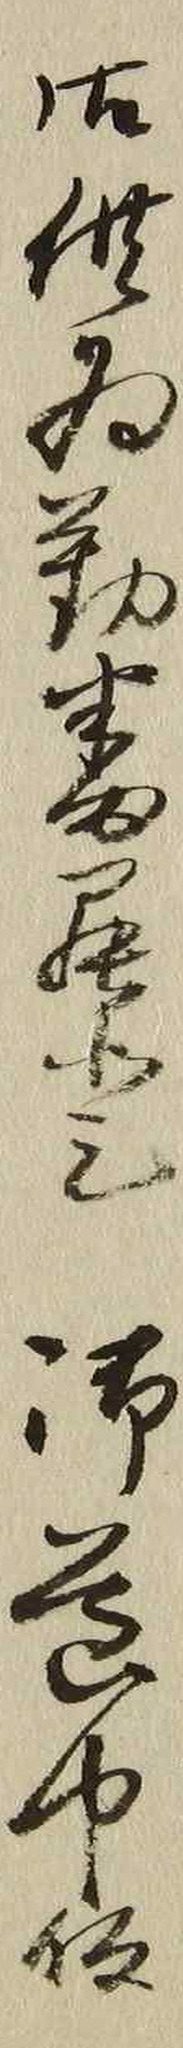御供為勤番罷登御道中仮
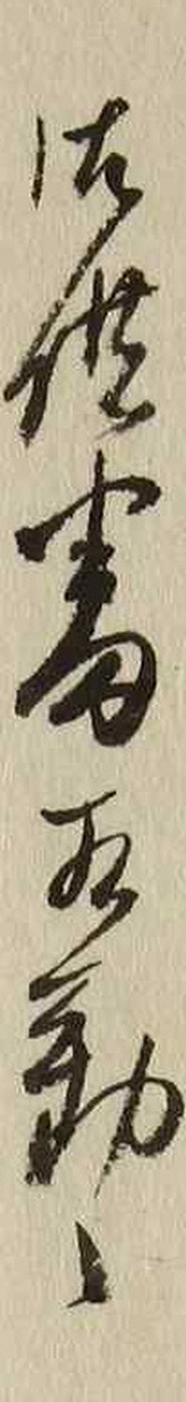御供番相勤候
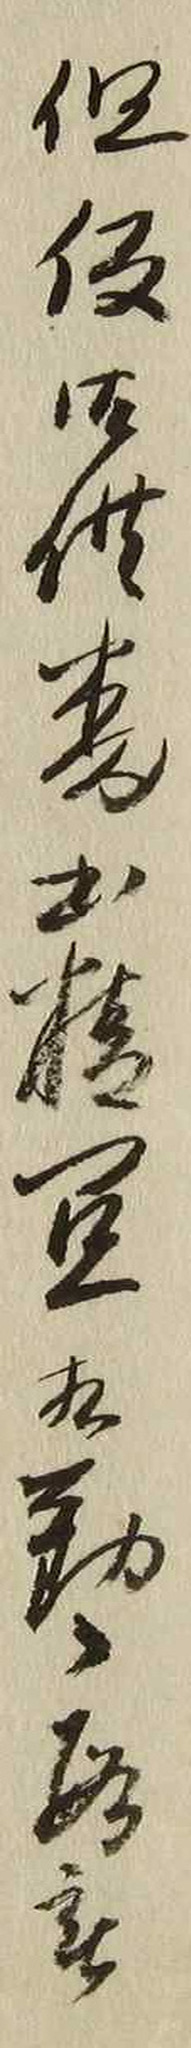但仮御供番出精宜相勤候段被
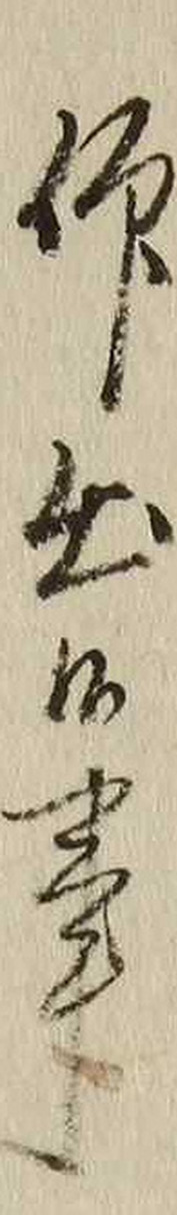仰出候事
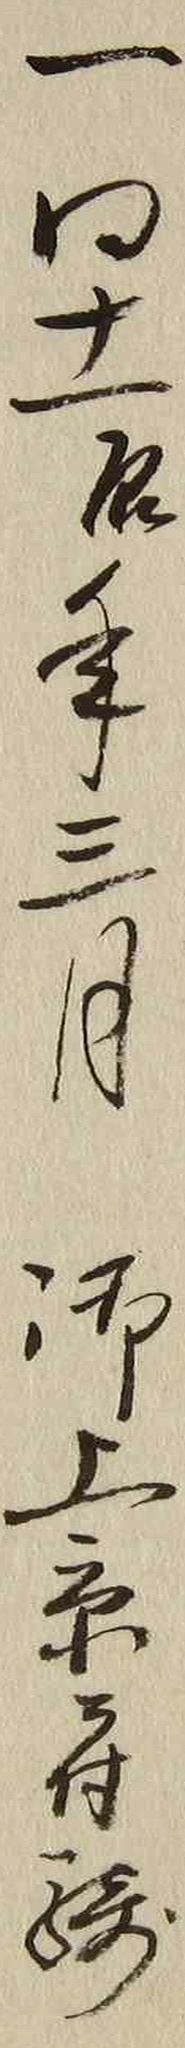一同十一辰年三月御上京ニ付騎
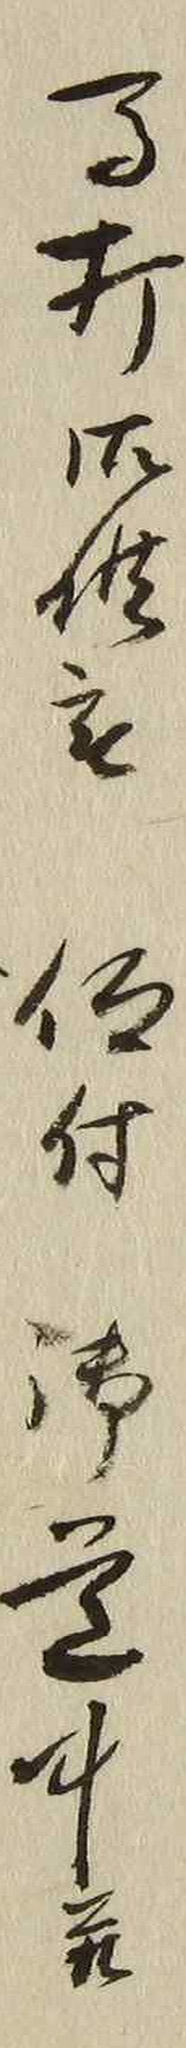馬打御供被仰付御道中并
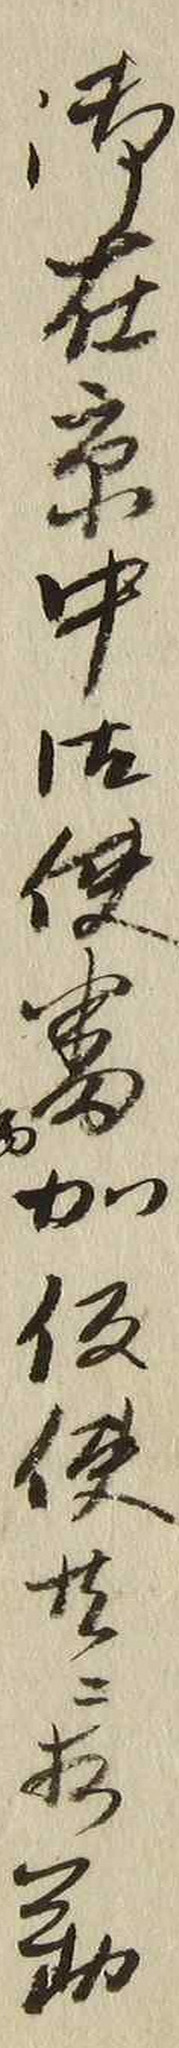御在京中御使番加仮使共ニ相勤
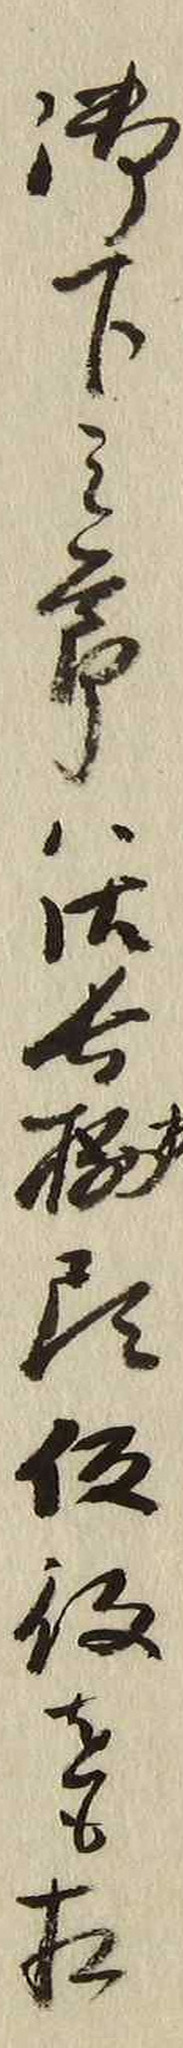御下之節ハ御長柄頭仮役をも相
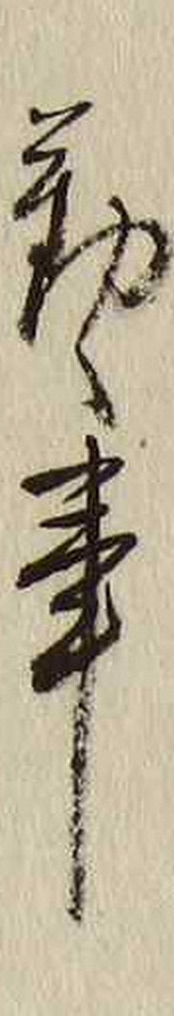勤候事
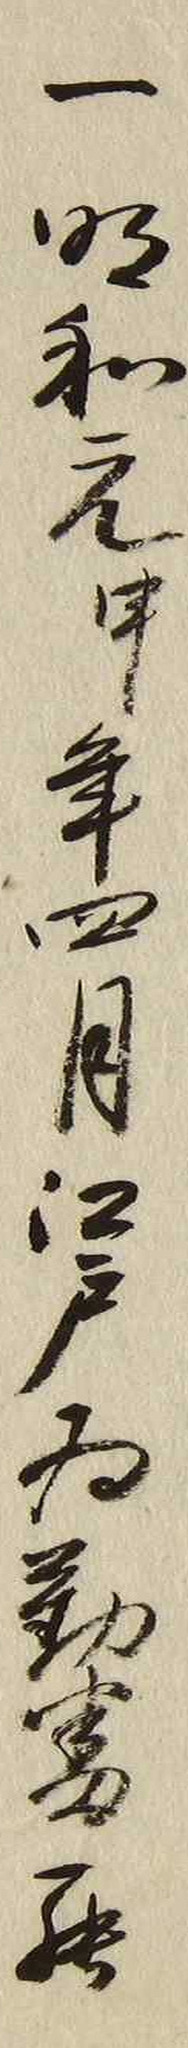一明和元申年四月江戸為勤番罷
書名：諸士系譜　巻之356　す之部6
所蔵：会津若松市立会津図書館
